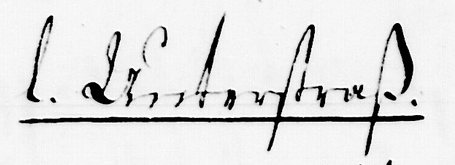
l. Unterstraß
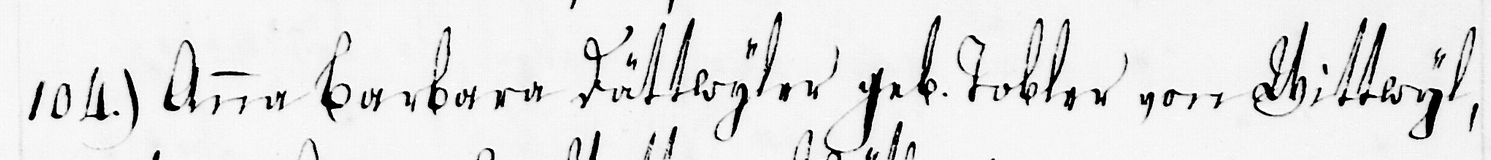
104.) Anna Barbara Dättwyler geb. Tobler von Wittwyl,
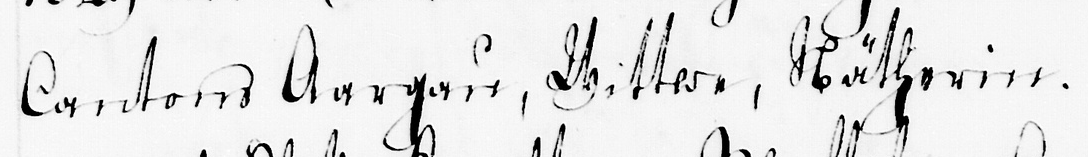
Cantons Aargau, Wittwe, Nätherin.
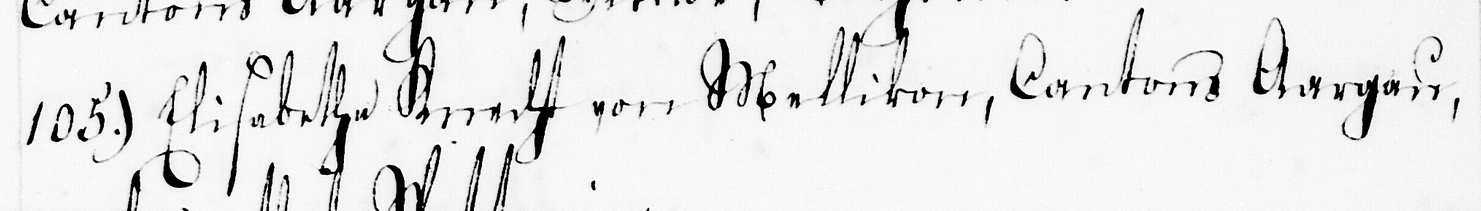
105.) Elisabetha Knecht von Mellikon, Cantons Aargau,
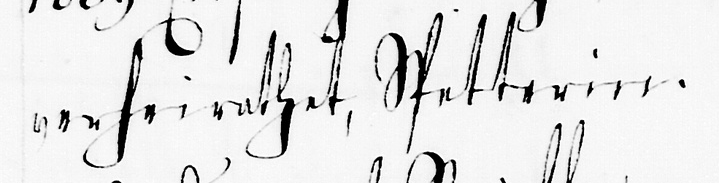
verheirathet, Spetterin.
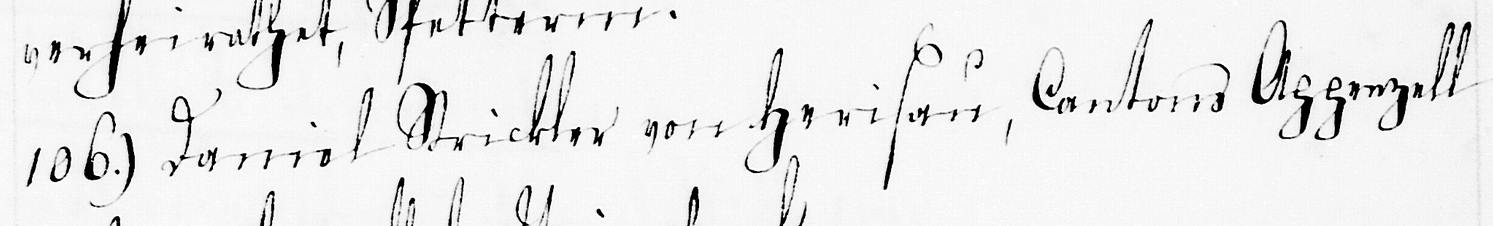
106.) Daniel Strickler von Herisau, Cantons Appenzell
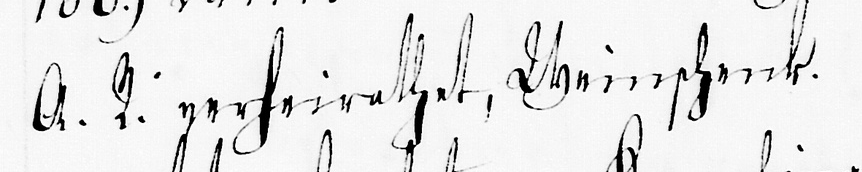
A. R. verheirathet, Weinschenk.
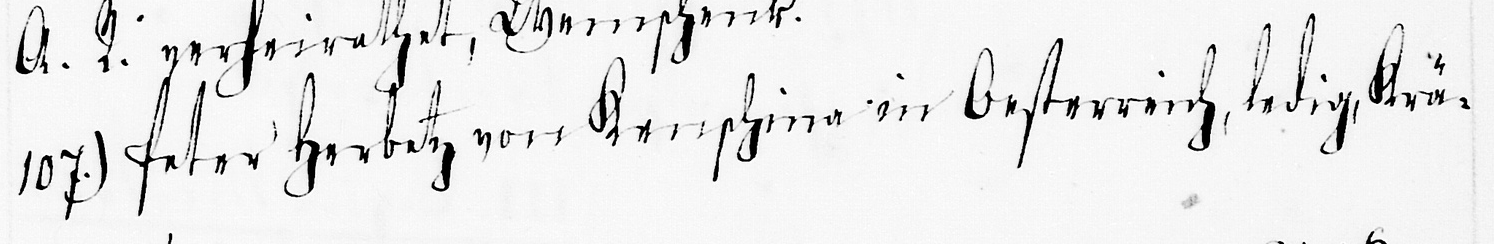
107.) Peter Herbetz von Kenschina in Oesterreich, ledig, Krä¬
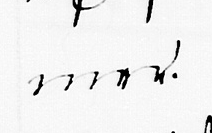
mer.
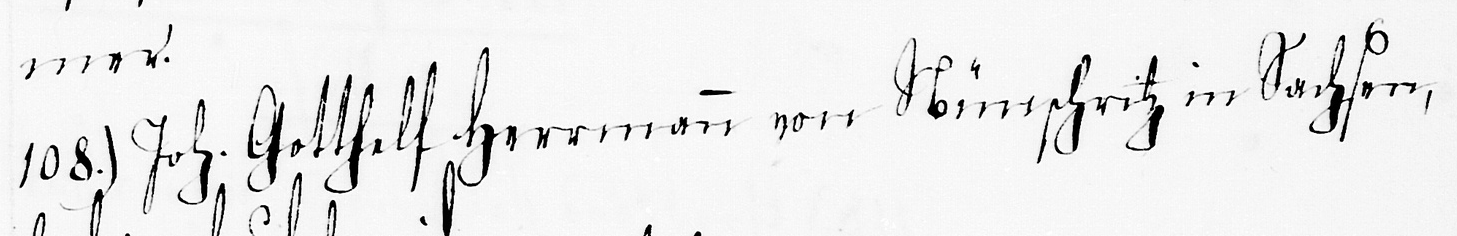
108.) Joh. Gotthelf Herrmann von Nünschritz in Sachsen,
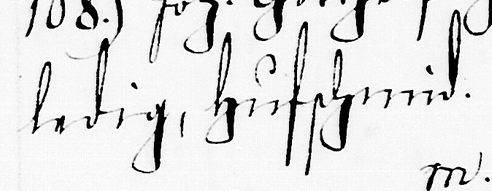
ledig, Hufschmid.
